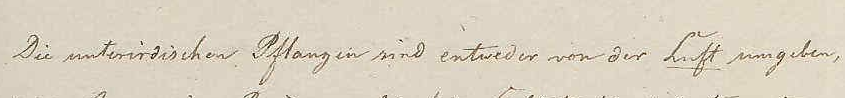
Die unterirdischen Pflanzen sind entweder von der Luft umgeben,
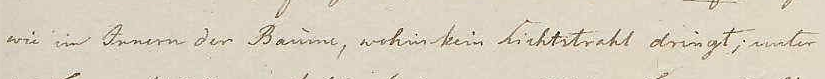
wie im Innern der Bäume, wohin kein Lichtstrahl dringt; unter
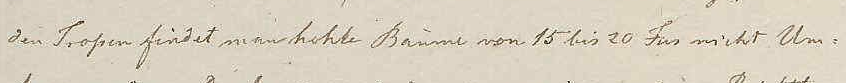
den Tropen findet man hohle Bäume von 15 bis 20 Fus nicht Um-
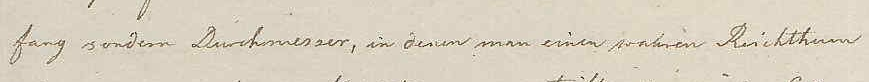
fang sondern Durchmesser, in denen man einen wahren Reichthum
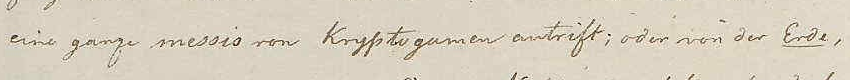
eine ganze messis von Kryptogamen antrift; oder von der Erde,
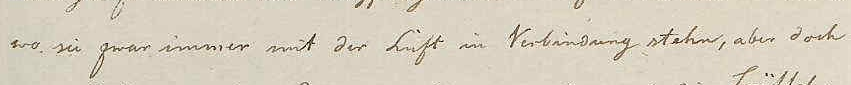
wo sie zwar immer mit der Luft in Verbindung stehn, aber doch
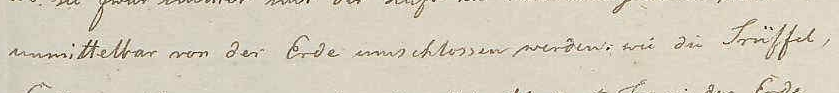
unmittelbar von der Erde umschlossen werden: wie die Trüffel,
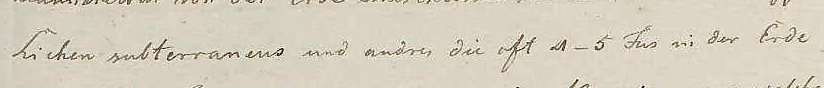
Lichen subterraneus und andre, die oft 4–5 Fus in der Erde
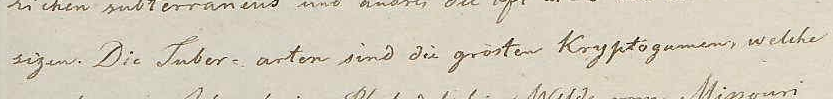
sizen. Die Tuber-arten sind die grösten Kryptogamen, welche
